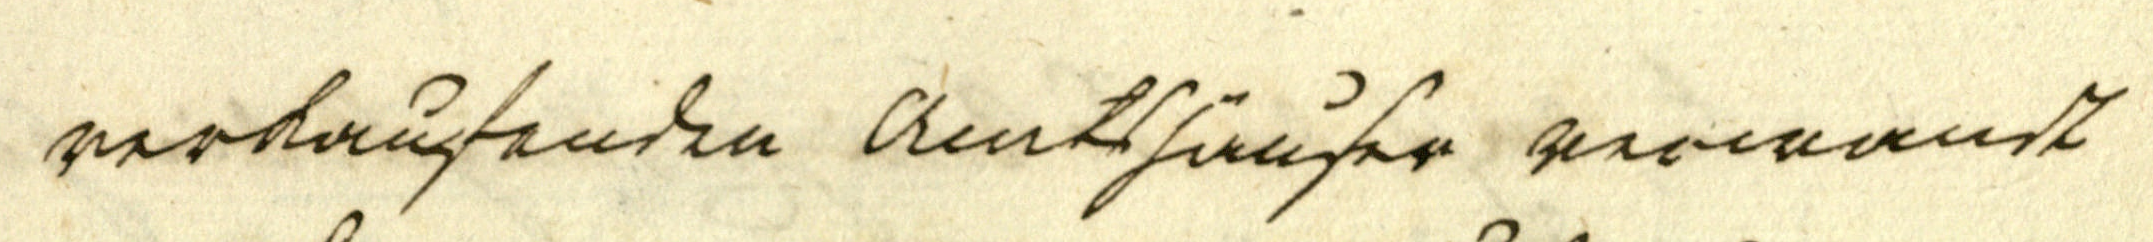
verkaufenden Amtshäuser verwandt
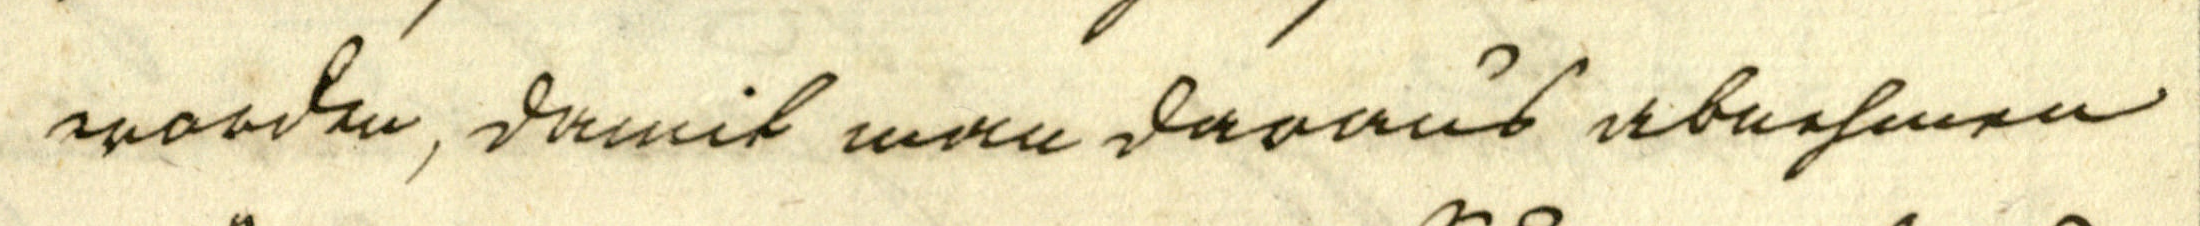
worden, damit man daraus abnehmen
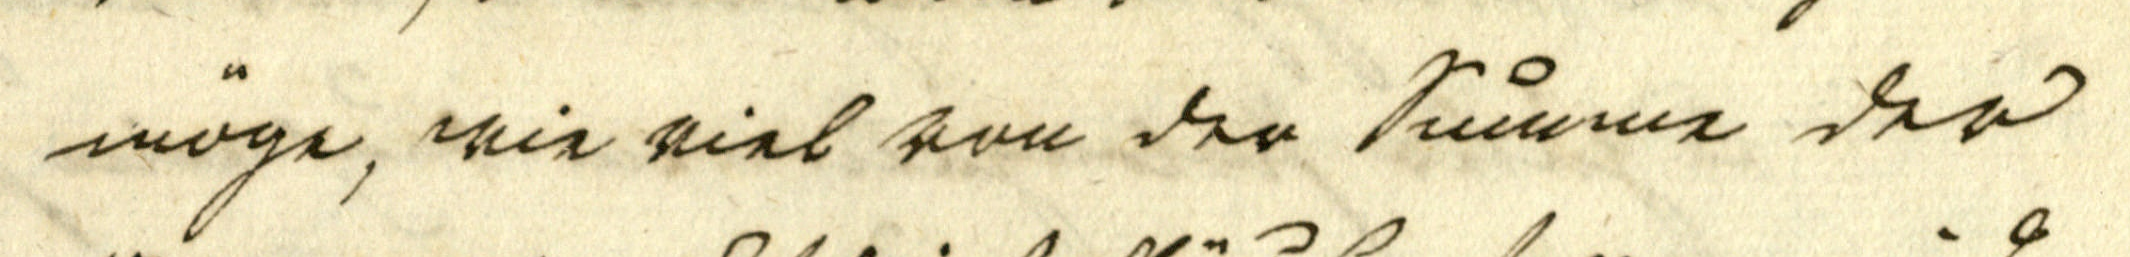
möge, wie viel von der Summe der
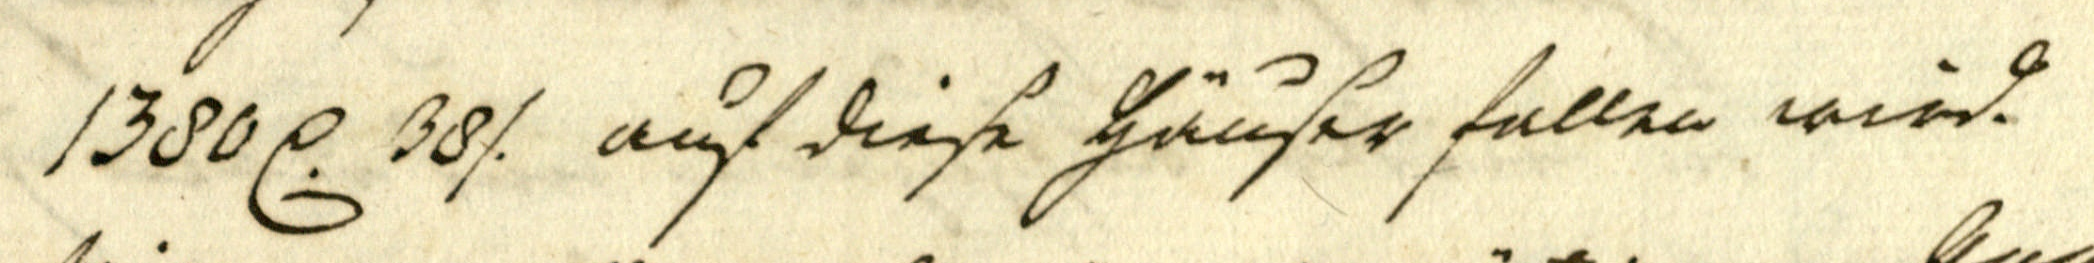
1380 l. 38 s. auf diese Häuser fallen wird.
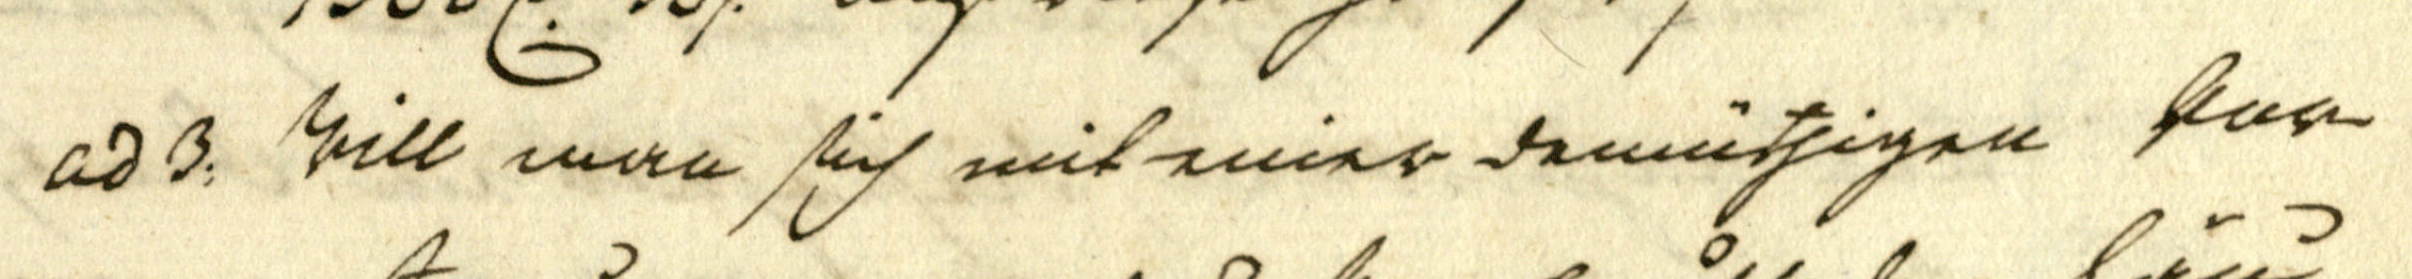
ad 3. Will man sich mit einer demüthigen Vor¬
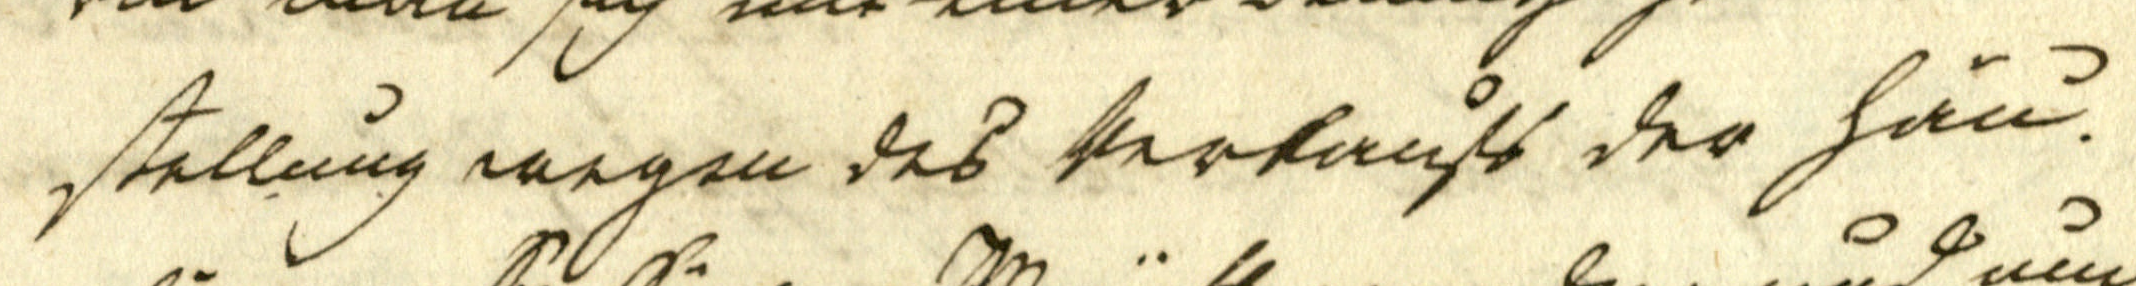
stellung wegen des Verkaufs der Häu¬
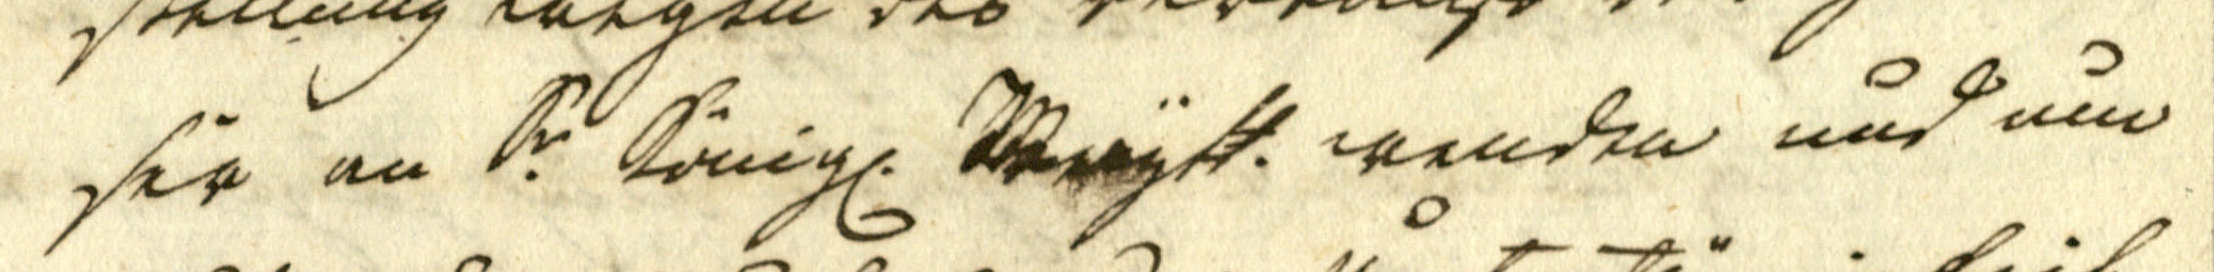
ser an Sr Königl. Maÿtt. wenden und um
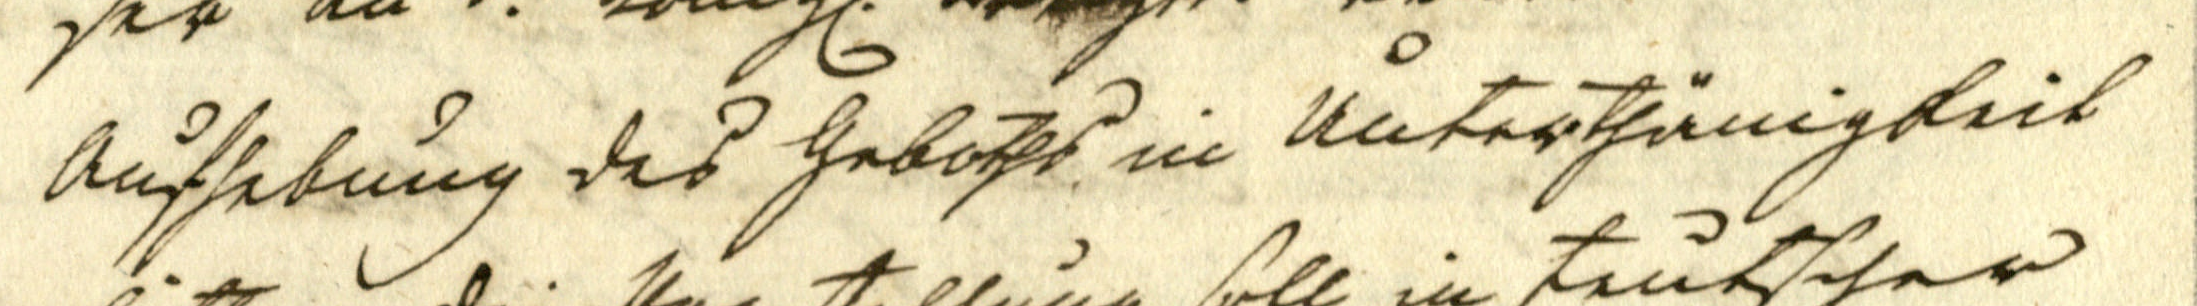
Aufhebung des Geboths in Unterthänigkeit
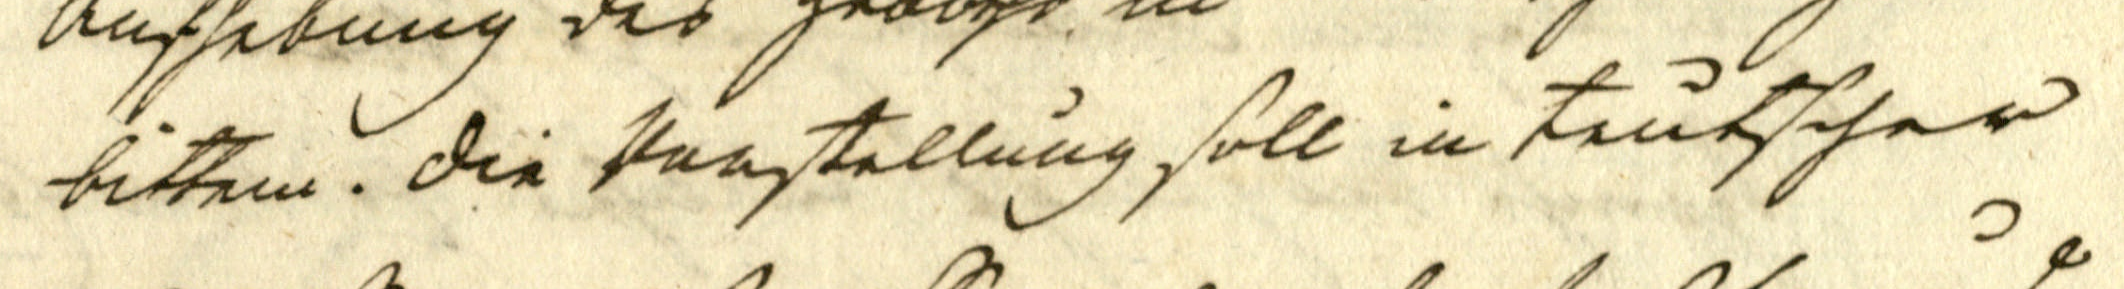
bitten. Die Vorstellung soll in teutscher
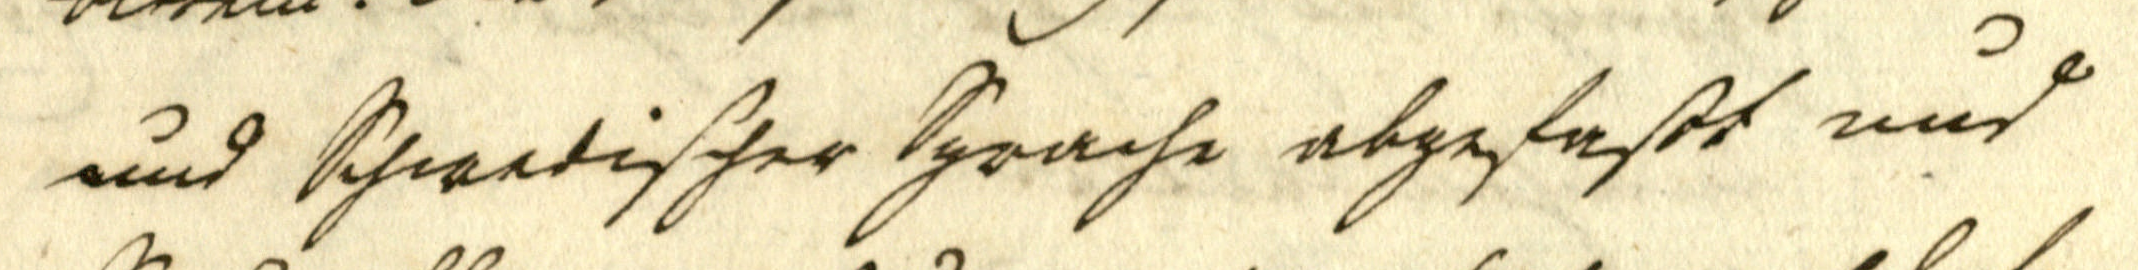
und Schwedischer Sprache abgefaßt und
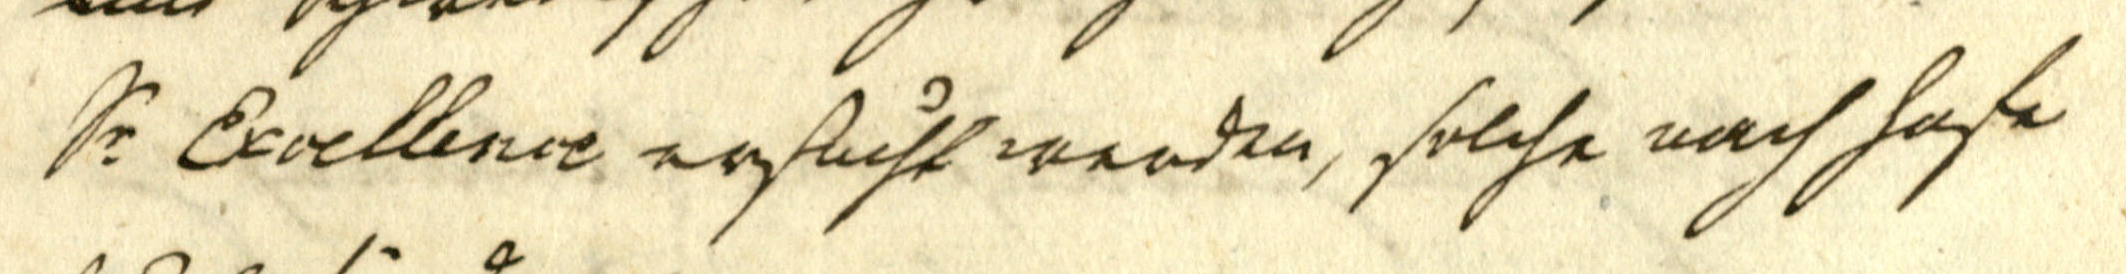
Sr Excellence ersucht werden, solche nach Hofe
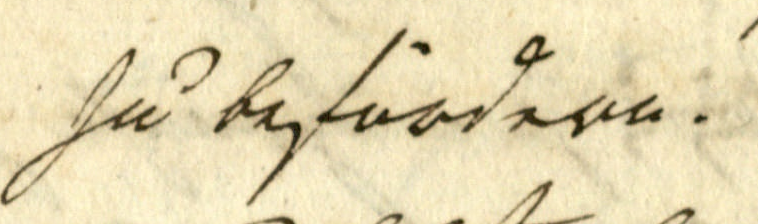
zu befördern.
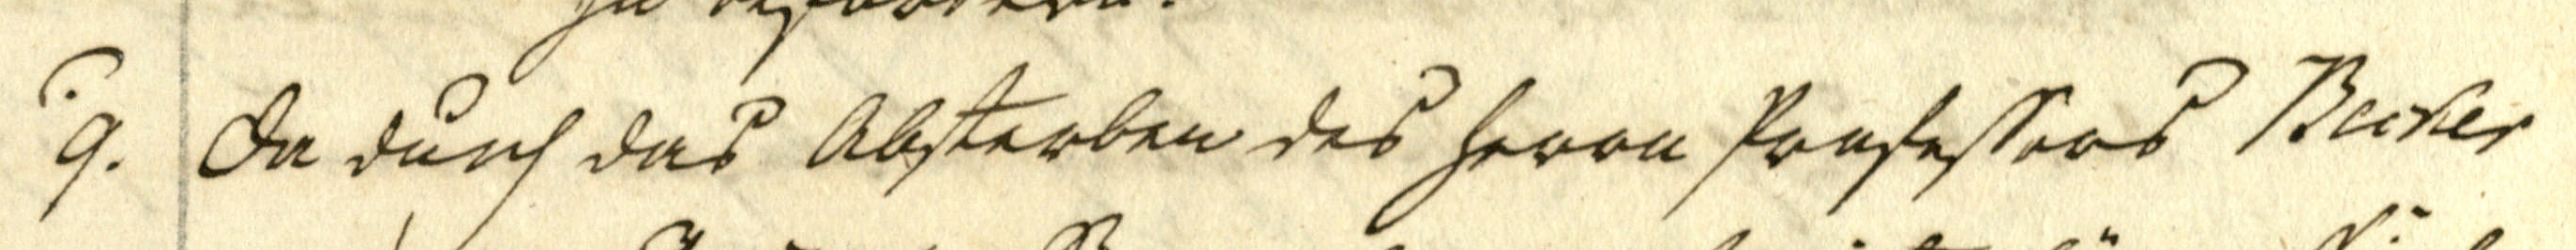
9. Da durch das Absterben des Herrn Professors Becker
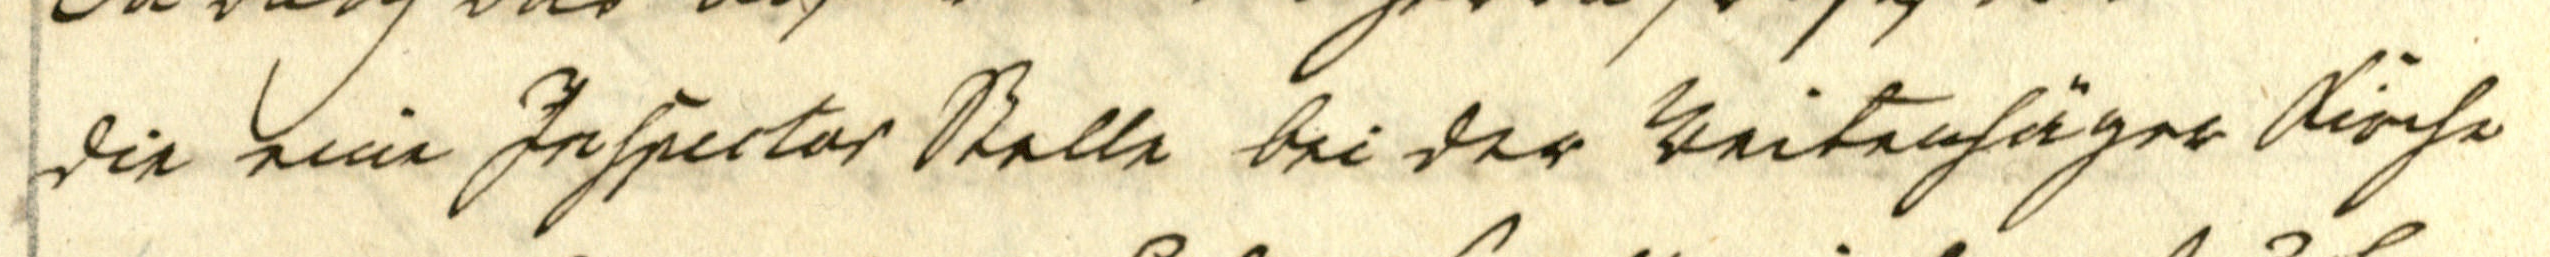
die eine Inspector Stelle bei der Weitenhäger Kirche
